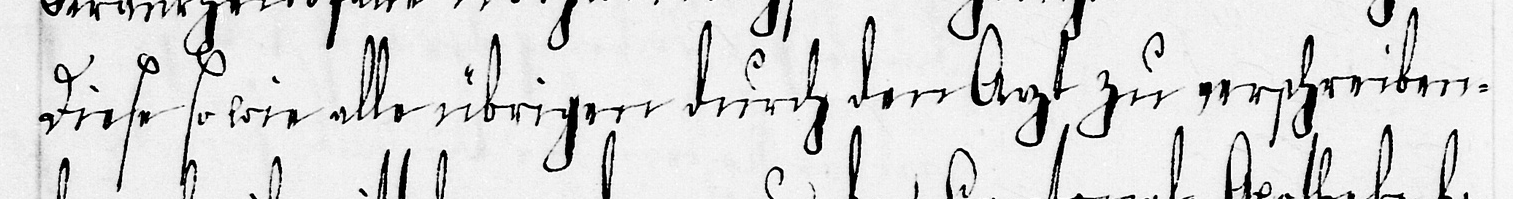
Diese sowie alle übrigen durch den Arzt zu verschreiben¬
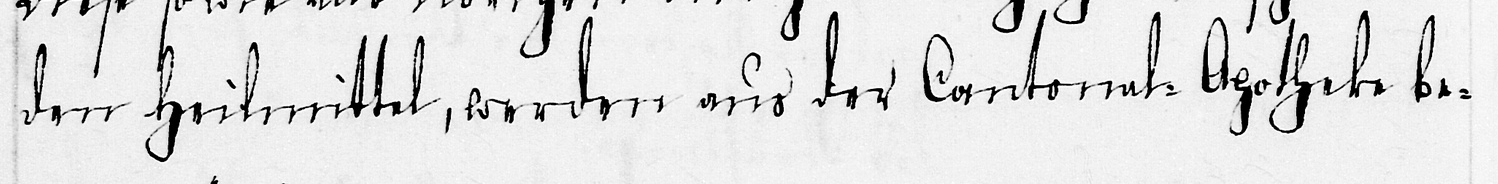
den Heilmittel, werden aus der Cantonal-Apotheke be¬
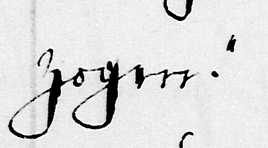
zogen.“
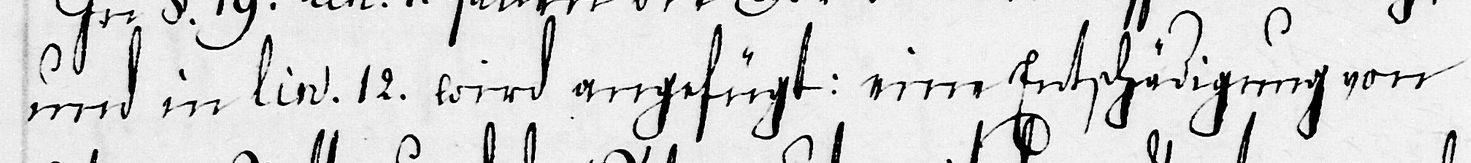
und in lin. 12. wird angefügt: eine Entschädigung von
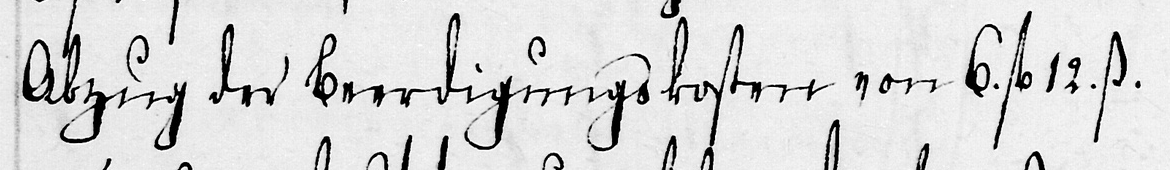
Abzug der Beerdigungskosten von 6. fl. 12.
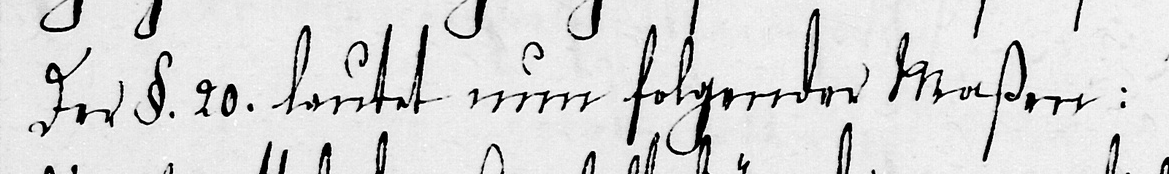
Der §. 20. lautet nun folgender Maßen:
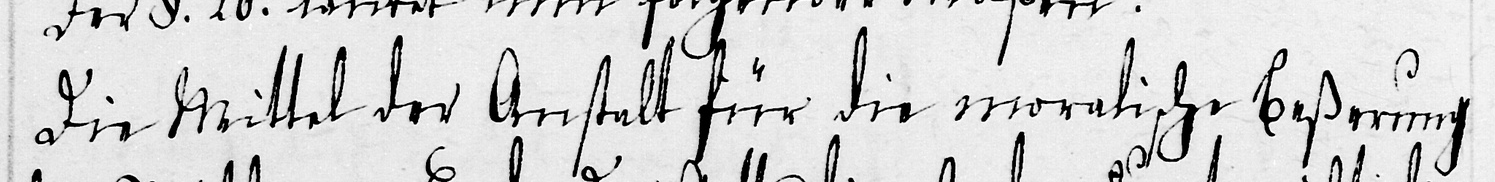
Die Mittel der Anstalt für die moralische Beßerung
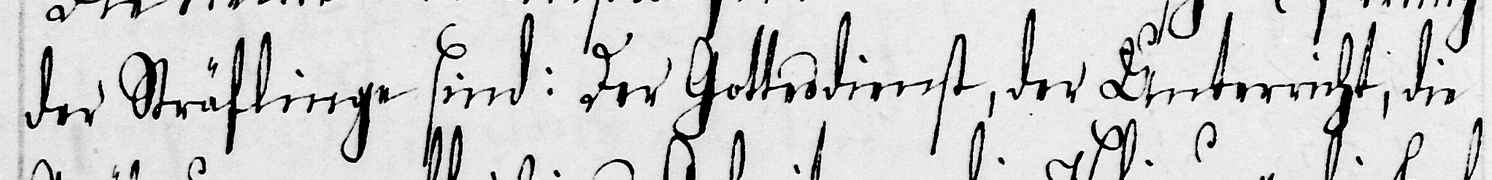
der Sträflinge sind: Der Gottesdienst, der Unterricht, die
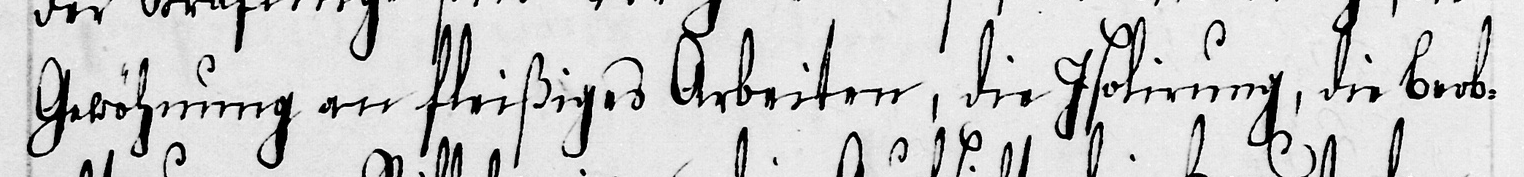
Gewöhnung an fleißiges Arbeiten, die Isolirung, die Beob¬
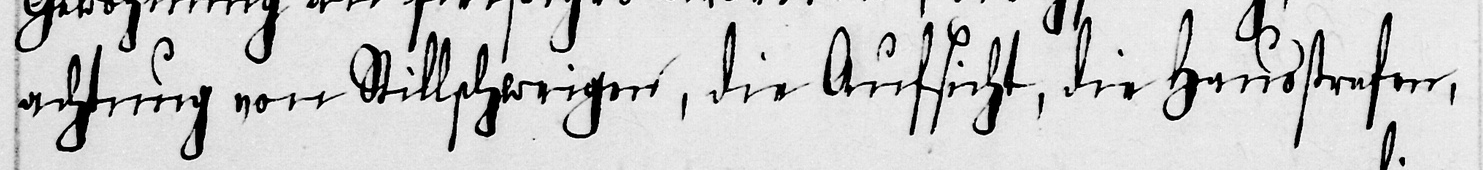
achtung von Stillschweigen, die Aufsicht, die Hausstrafen,
